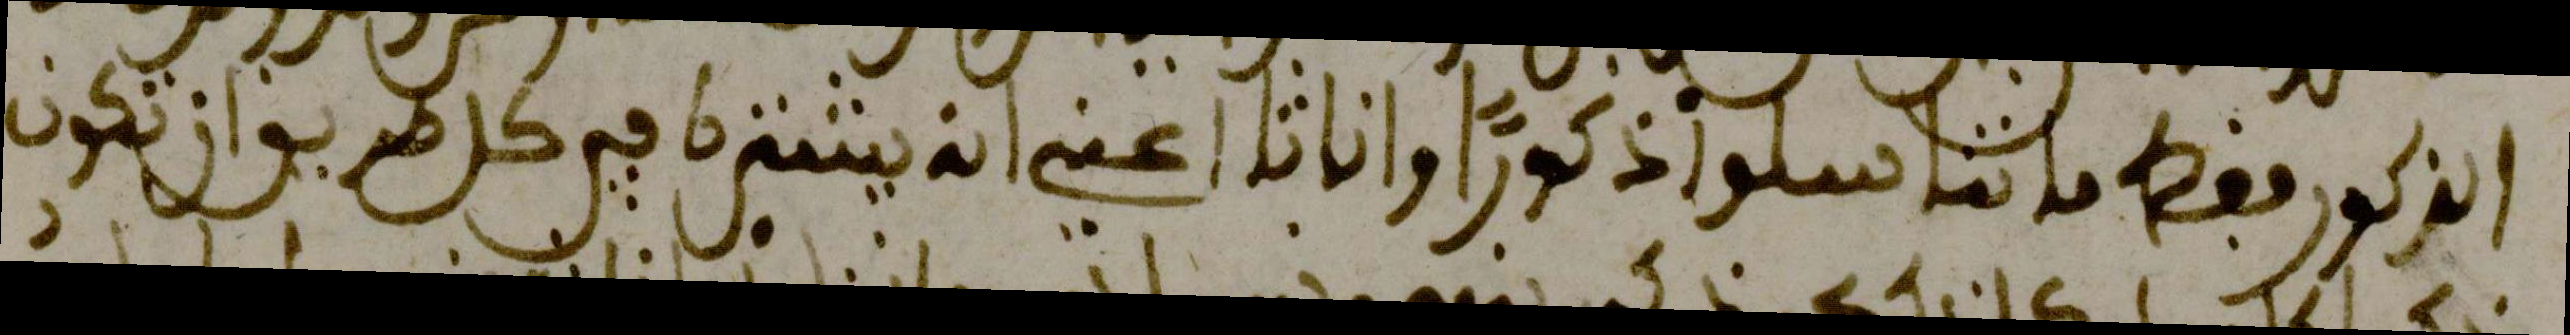الذكور فقط ما تناسلوا ذكورا واناثا اعني انه يشترط في كل طريق ان تكون
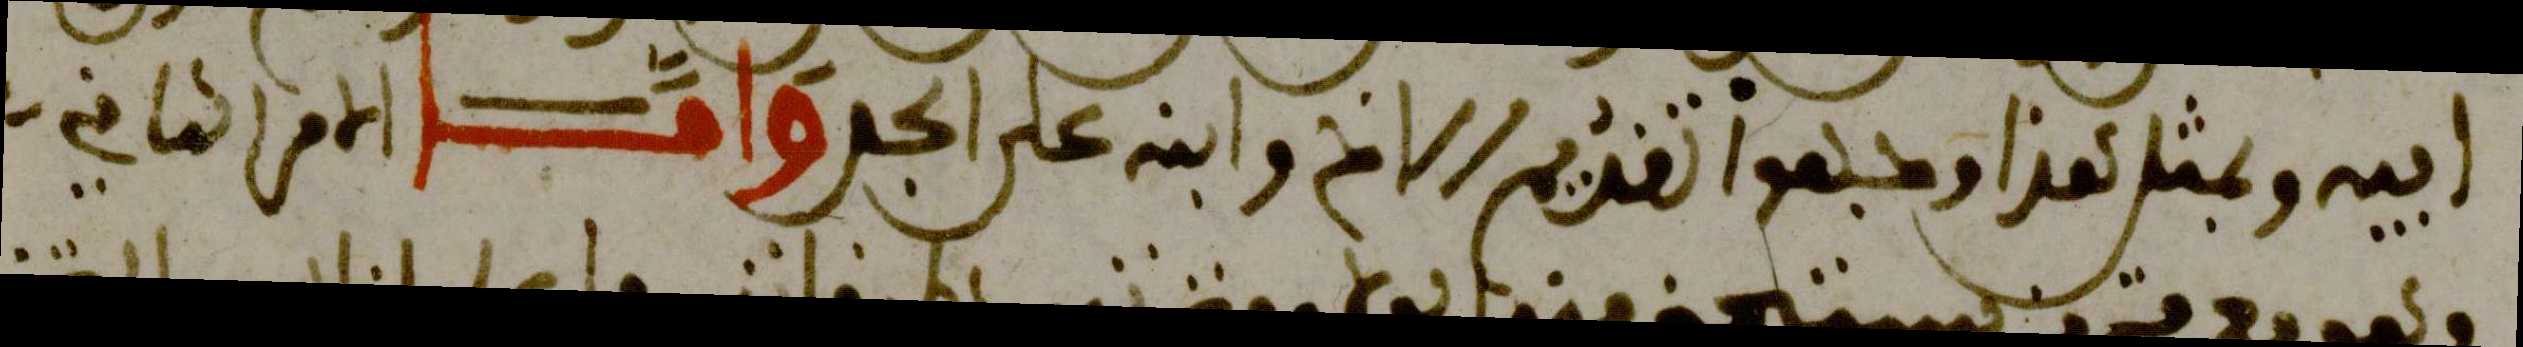ابيه وبمثل هذا وجهوا تقديم الاخ وابنه على الجد وامّا الامر الثاني
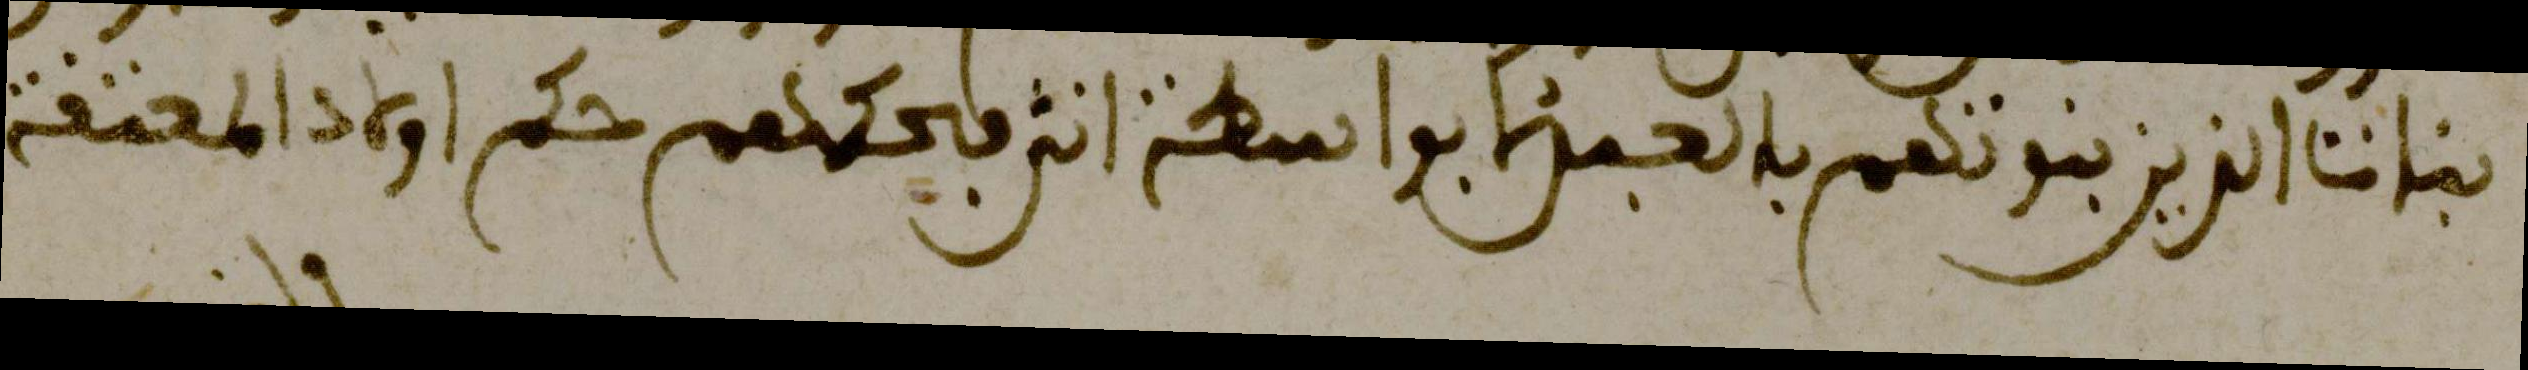بنات الذين بنوتهم بالعبد لابو اسطة انثى فحكمهم حكم اولاد المعتقة
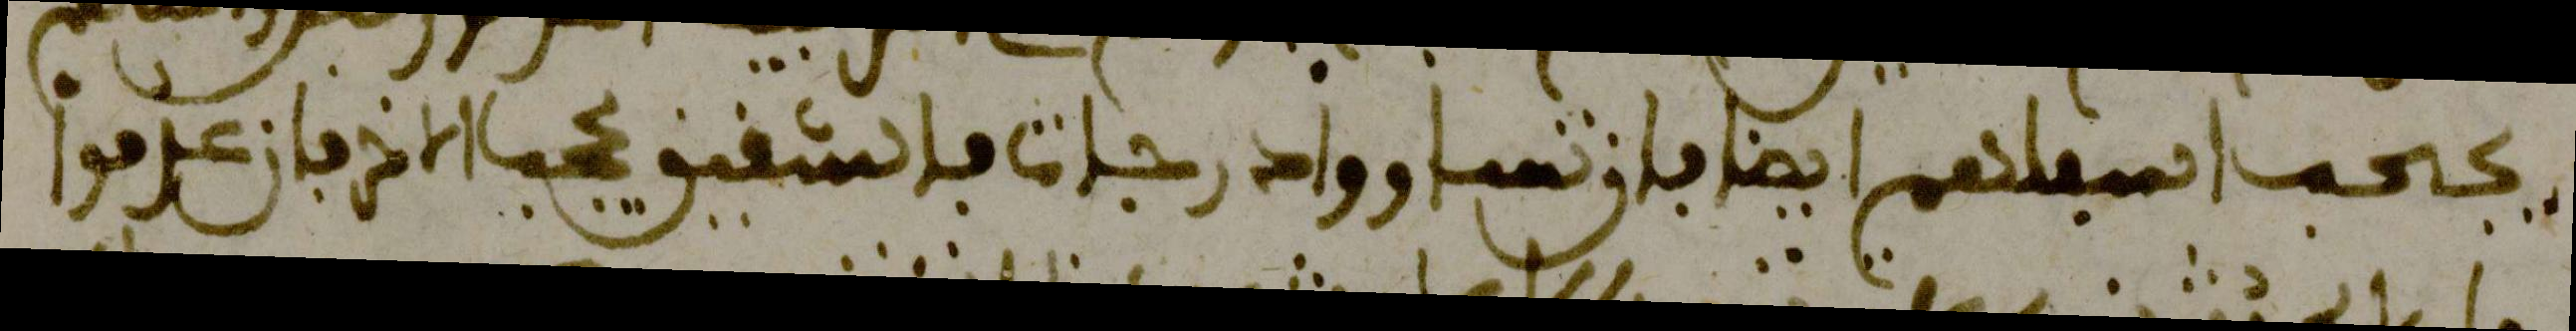يحجب اسفلهم ايضا فان تساو واد رجات فالشقيق يحجب الاخر فان عدموا
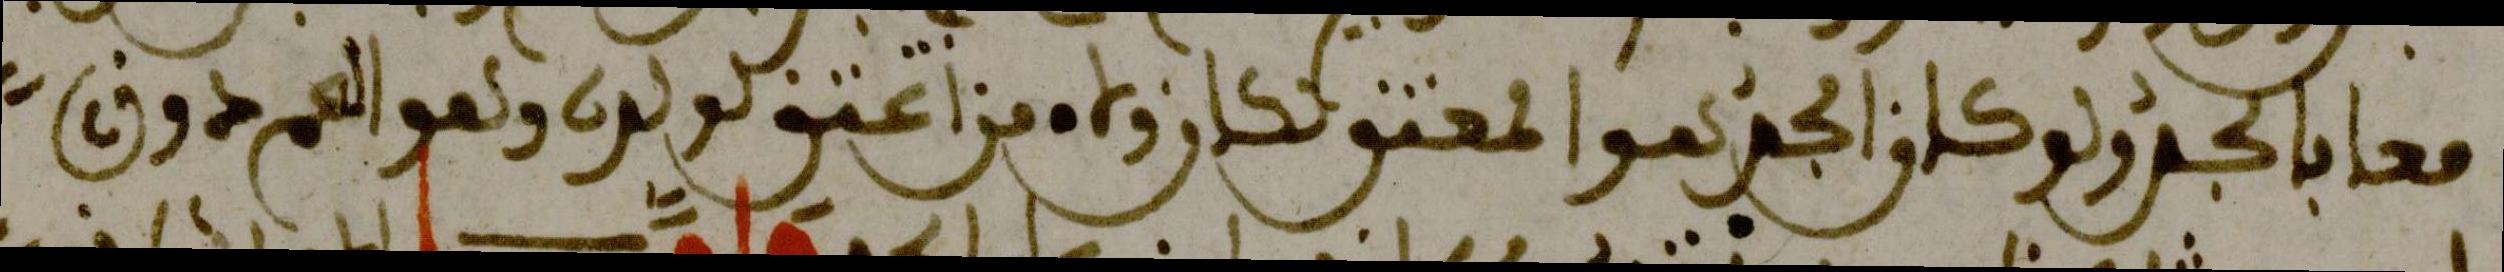معا فالجد ولو كان الجد هو المعتق لكان ولاء من اعتق لولده وهو العم دون
